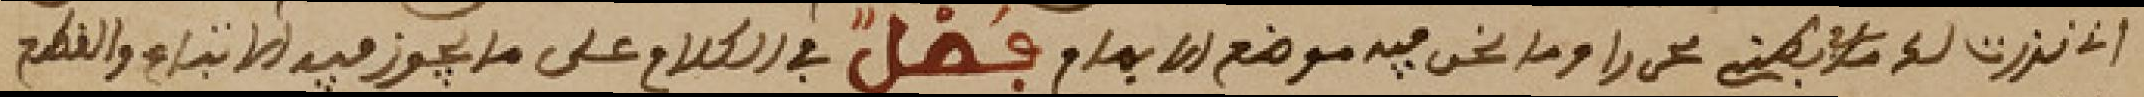انى نذرت لك ما في بطنه محررا وما نحن فيه موضع الابهام فصل في الكلام على ما يجوز فيه الاتباع والقطع
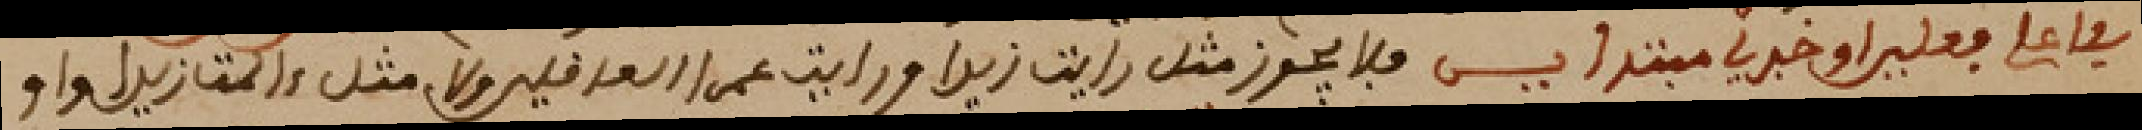بفاعل فعلين او خبري مبتدأين فلا يجوز مثل رايت زيدا ورايت عمرا العاقلين ولا مثل ءالمت زيدا واو
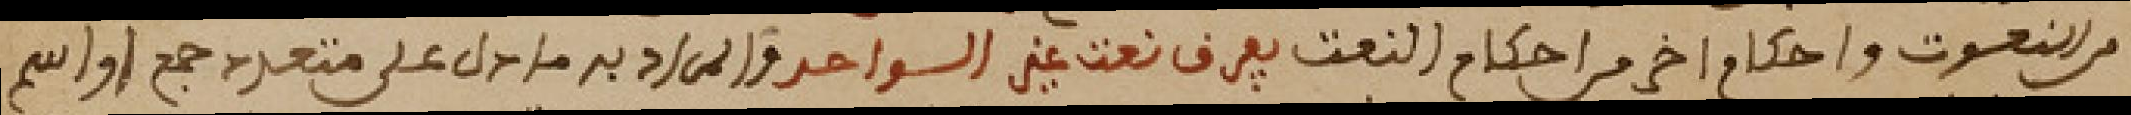من المنعوت واحكام اخر من احكام النعت يفرق نعت غير الواحد والمراد به ما دل على متعدد جمع او اسم
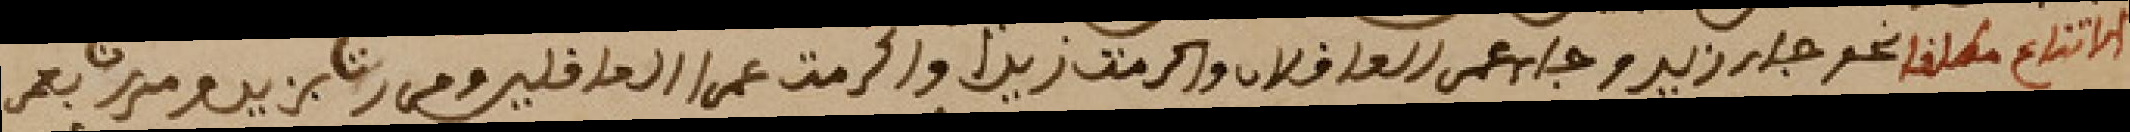الاتباع مطلقا نحو جاء زيد وجاد عمر العاقلان واكرمت زيردا واكرمت عمرا العاقلين ومررت بزيد ومررت بعمر
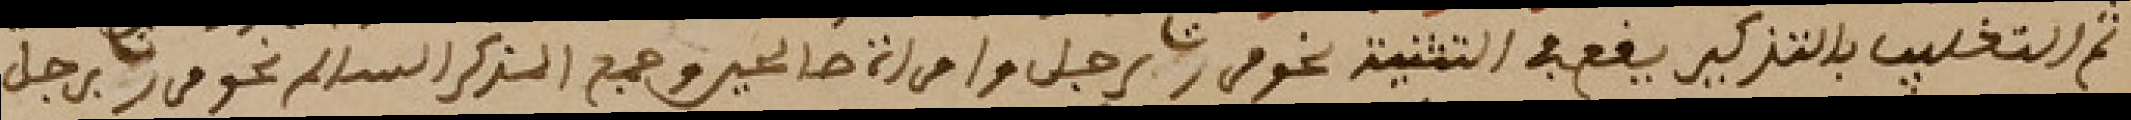ثم التغليب بالتذكير يقع في التثنية نحو مررت برجل وامراة صالحين وجمع المذكر السالم نحو مررت برجل
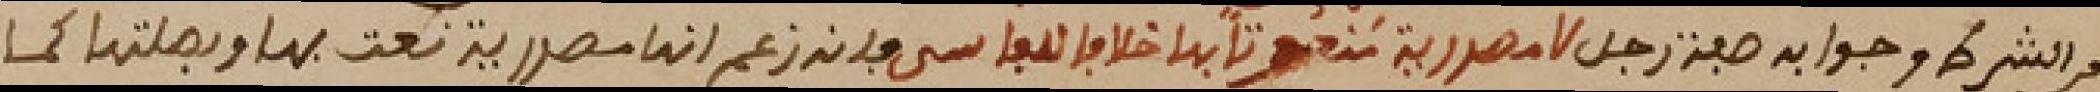من الشرط وجوابه صفة رجل لا مصدرية منعوتا بها خلافا للفاسى فانه زعم انها مصدرية نعت بها وبصلتها كما
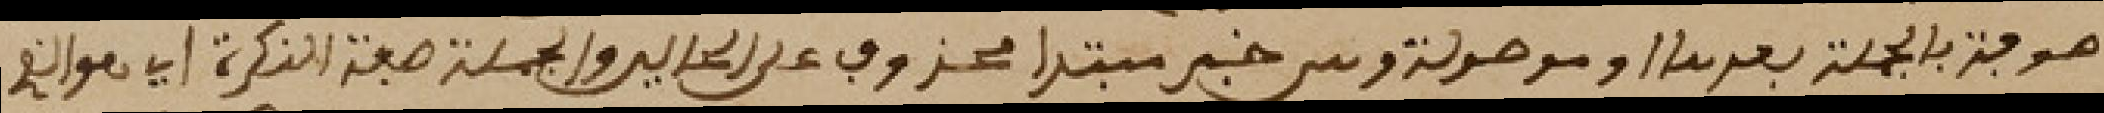صوفة بالجملة بعدها او موصولة وهي خبر مبتدا محذوف على الحالين والجملة صفة النكرة اي هو الذي
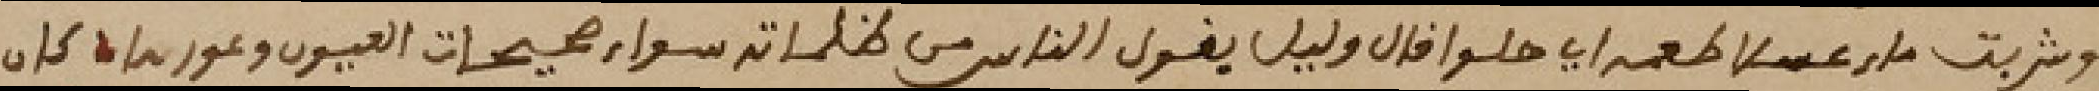وشربت ماء عسلا طعمه اي حلوا قال وليل يقول الناس من ظلماته سواء صحيحات العيون وعوراء كان
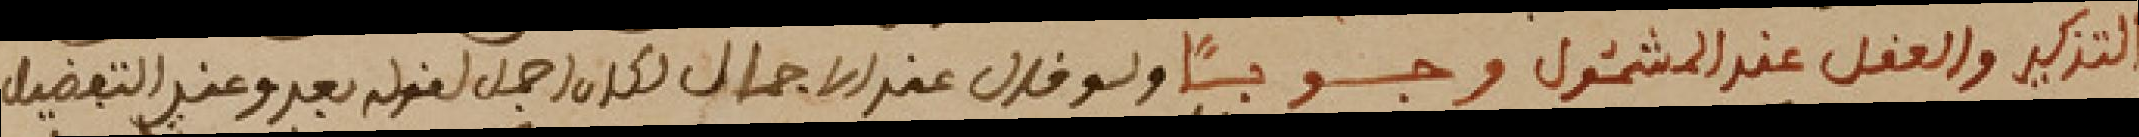التذكير والعقل عند المشمول وجوبا ولو قال عند الاجمال لكان اجمل لقوله بعد وعند التفضيل
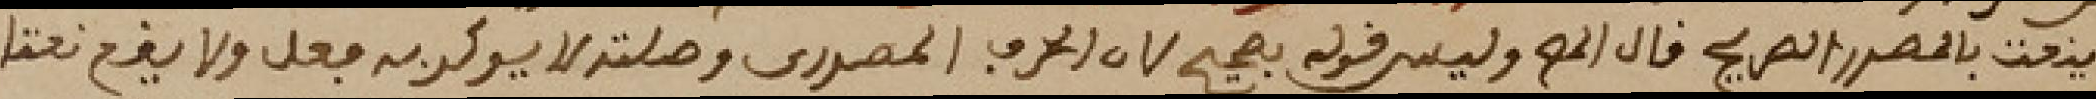ينعت بالمصدر الصحيح قال المصر وليس قوله بصحيح لان الحرف المصدرى وصلته لا يوكد به فعل ولا يقع نعتا
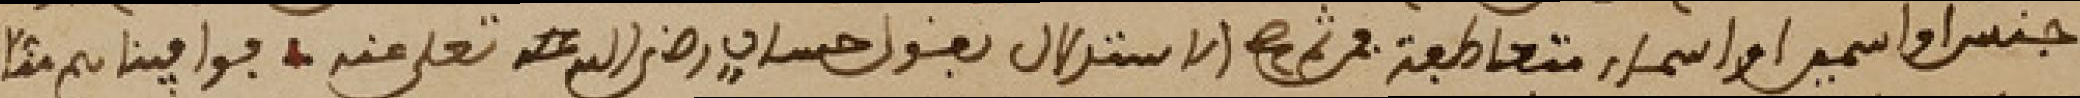جنس او اسمين او اسماء متعاطفة فمن ثم صح الاستدلال بقول حسافي رضى الله تعلى عنه فوافيناهم مما
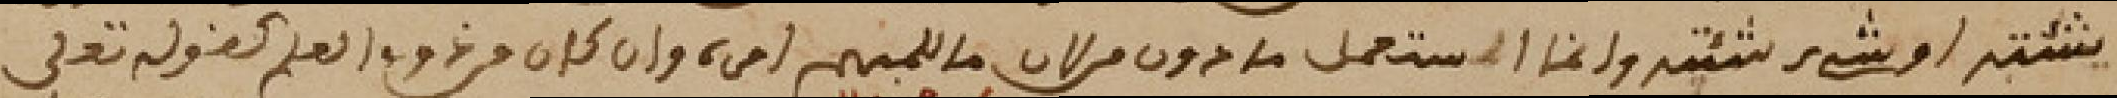#يشئته او شىء شئته وانما المستعمل مادون من لان ما للمبهم امره وان كان من ذو العلم كقوله تعلى
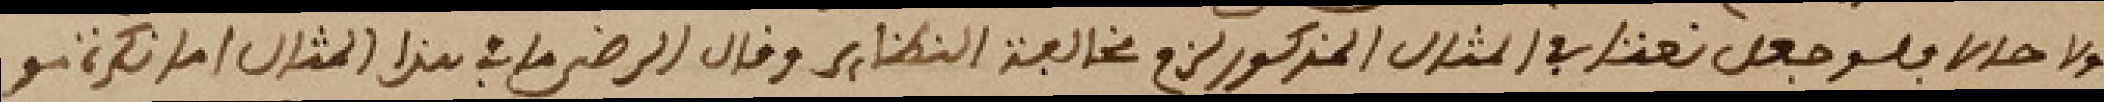ولا حالا ولو جعل نعتا في المثال المذكور لزم مخالفة النظائر وقال الرضى ما في هذا المثال اما نكرة مو
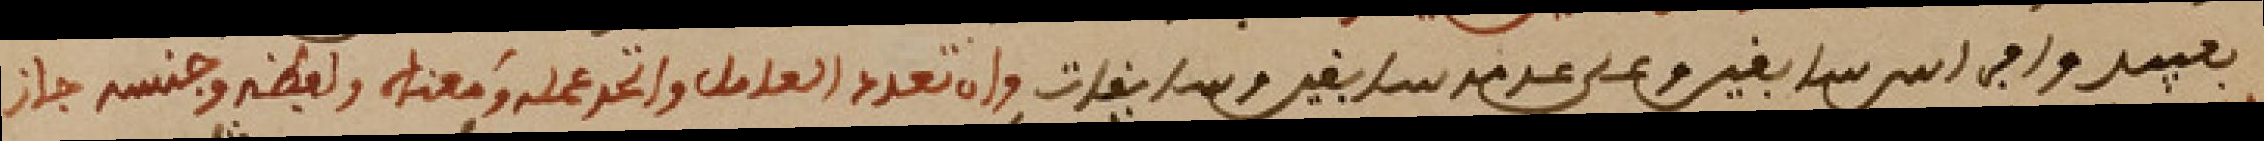بعبيد وافراس سابقين وعلى عدمه سابقين وسابقات وان تعدد العامل واتحد عمله ومعناه ولفظه وجنسه جاز
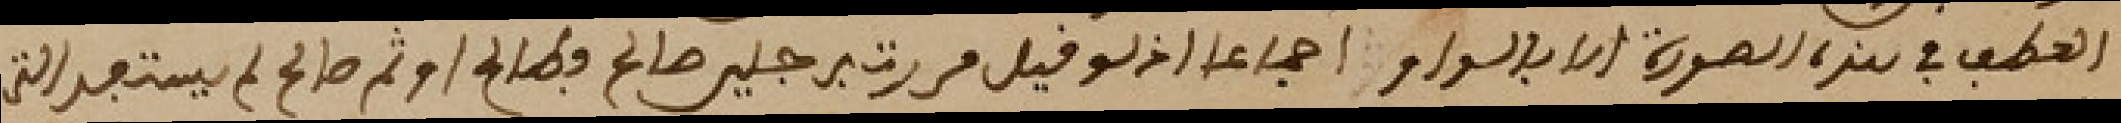العطف في هذه الصورة الا بالواو اجماعا اذ لو قيل مررت برجلين صالح فطالح او ثم صالح لم يستفد التر
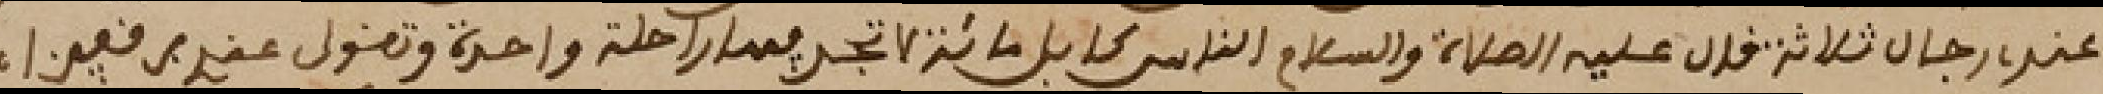عنده رجال ثلاثة قال عليه الصلاة والسلام والناس كابل مائة لا تجر فيهما راحلة واحدة وتقول عقير بل فقير
